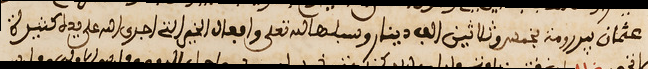عثمان بير رومة بخمس وثلاثين الفه دينار وسبلها لله تعلى وافعال الخير التي اجرى الله على يده كثيرة
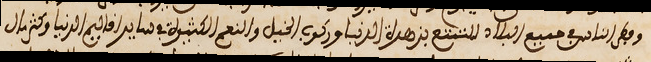وفطر الناي في جميع البلاد للتمتع بزهرة الدنيا وركوب الخيل والنعم الكثيرة في ساير اقاليم الدنيا وكثر مال
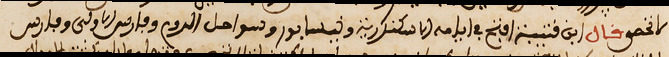لا تحصى قال ابن قتيبة افتح في ايامه الاسكندرية ونيسابور وسواحل الروم وفارس الاولى وفارس
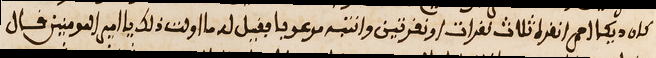كان ديكا احمرا تقره ثلاث نقرات او نقرتين وانتبه مرعوبا فقيل له ما اولت ذلك يا امير المومنين قال
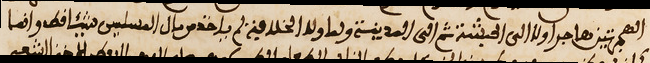الهجرتين هاجر اولا الى الحبشة ثم الى المدينة ولما ولا الخلافة لم ياخذ من مال المسلمين شيئا قط وانما
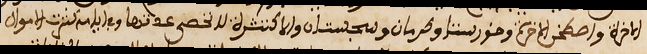الاخرة واصطخر الاخرة وجورستا وكرمان وسجستان والا كتثرة لا تحصى عدتها وفي ايامه كثرت الاموال
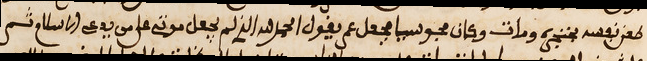طعن نفسه بخنجره ومات وكان مجوسيا فجعل عمر يقول الحمد الله الذي لم يجعل موتى على من يدعى الاسلام ثم
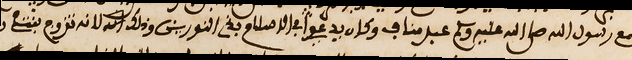مع رسول الله صلى الله عليه وسلم عبد مناف وكان يدعي ا في الاسلام بذى النورين وذلك الله لانه تزوج بنتى و
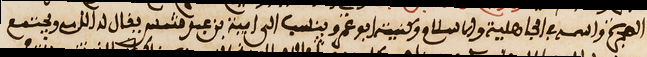الهجرة واسمه في الجاهلية والاسلام وكنيته ابو عمر وينسب الى امية بن عبد شمس يقال له الامى ويجتمع
